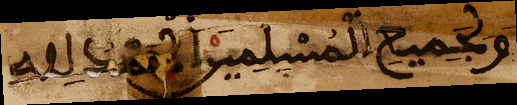ولجميع المسلمين الحمد لله
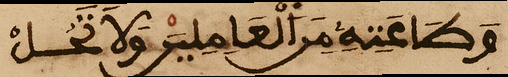وطاعته من العالمين ولا تحل
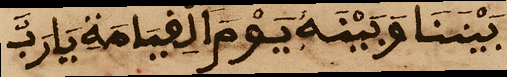بيننا وبينه يوم القيامة يا رب
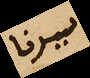سيدنا
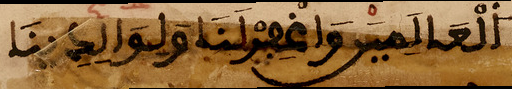العالمين واغفر لنا ولوالدينا
